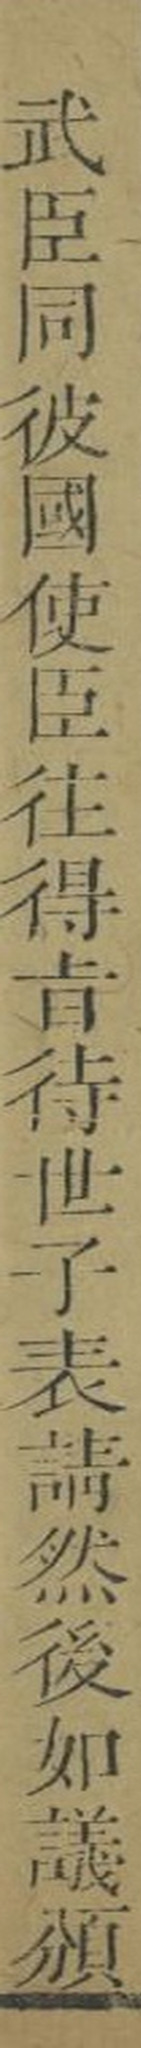武臣同彼国使臣往得旨待世子表請然後如議頒
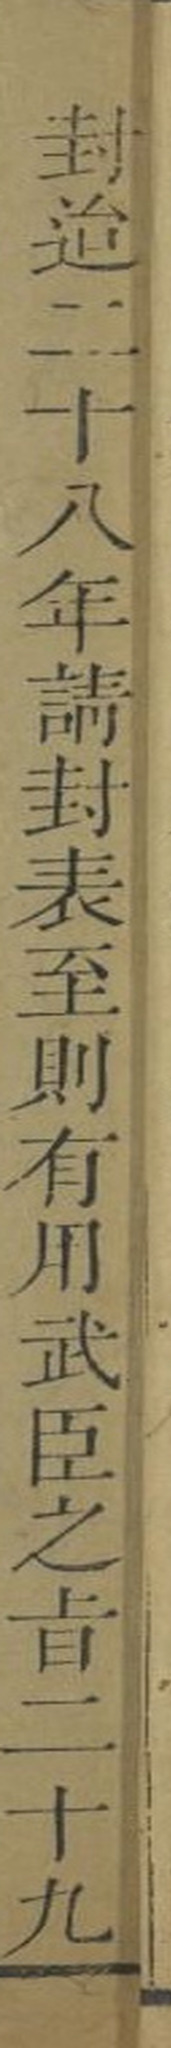封迨二十八年請封表至則有用武臣之旨二十九
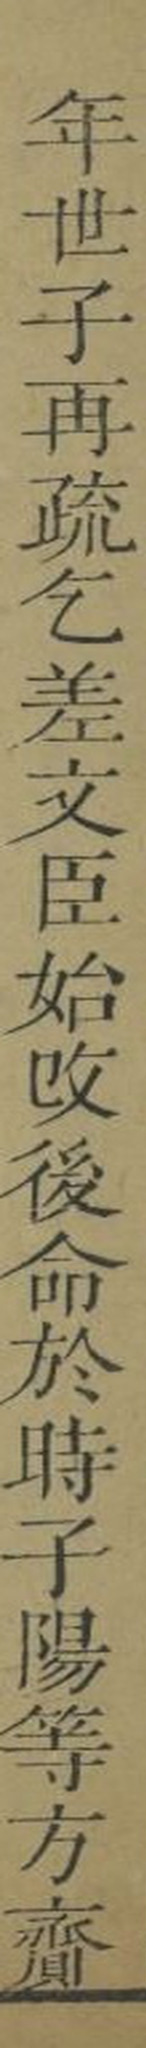年世子再疏乞差文臣始改後命於時子陽等方齎
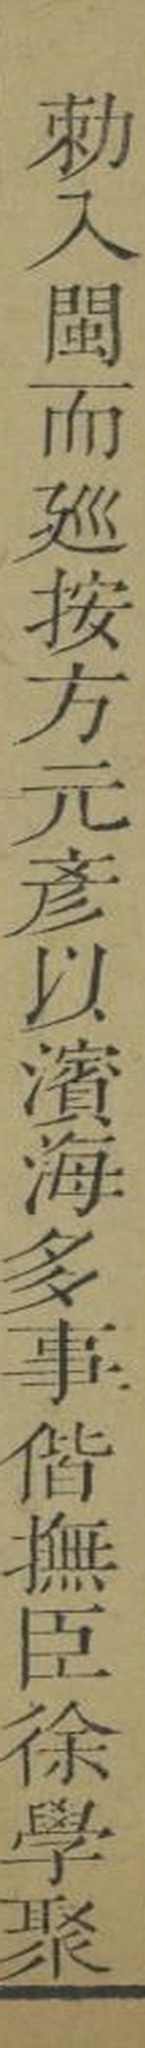勅入閩而巡按方元彦以浜海多事偕撫臣徐学聚
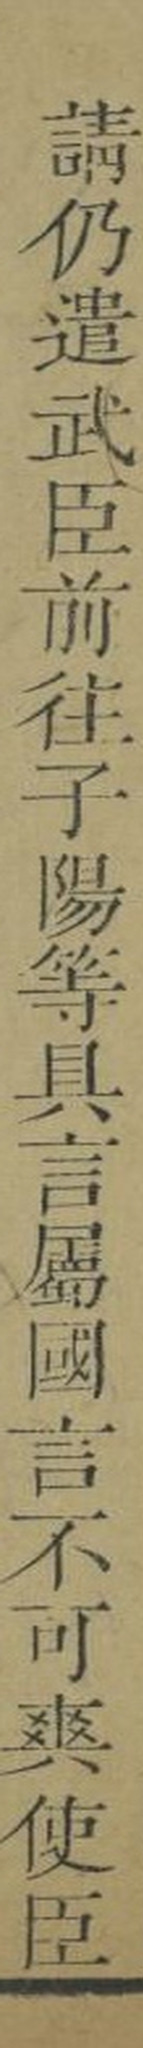請仍遣武臣前往子陽等具言属国言不可爽使臣
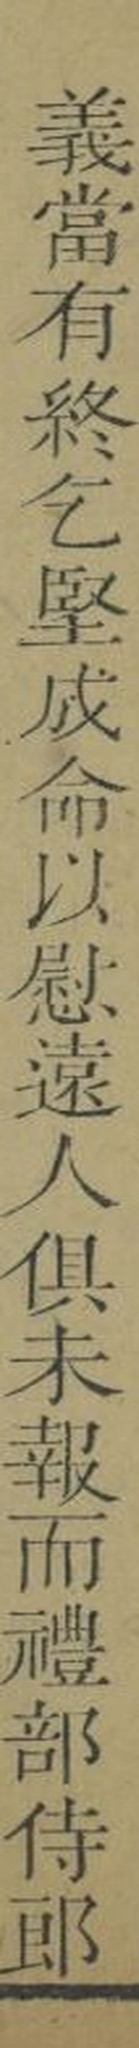義当有終乞堅成命以慰遠人俱未報而礼部侍郎
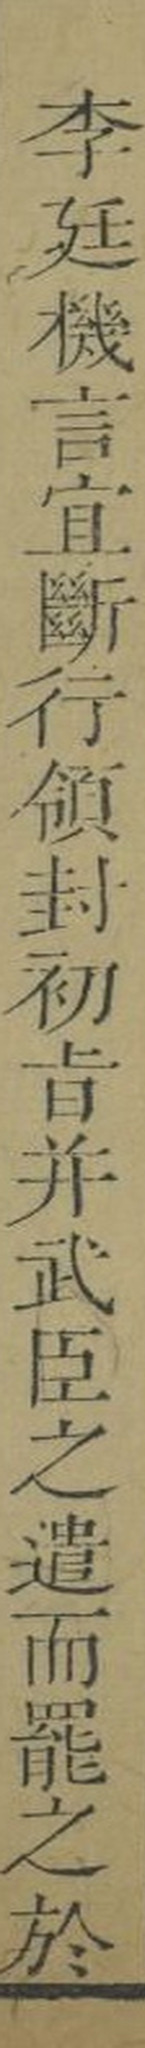李廷機言宜断行領封初旨并武臣之遣而罷之於
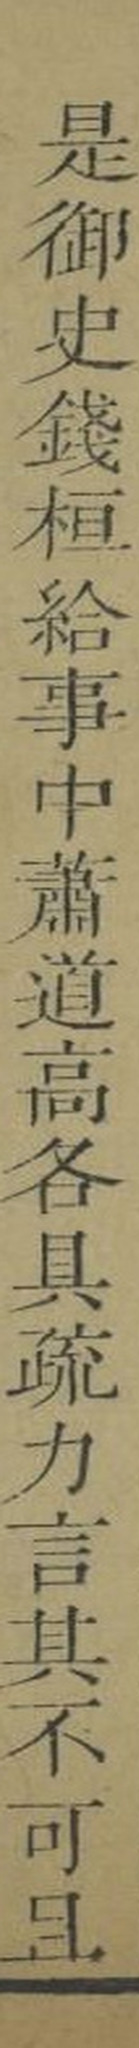是御史銭桓給事中蕭道高各具疏力言其不可且
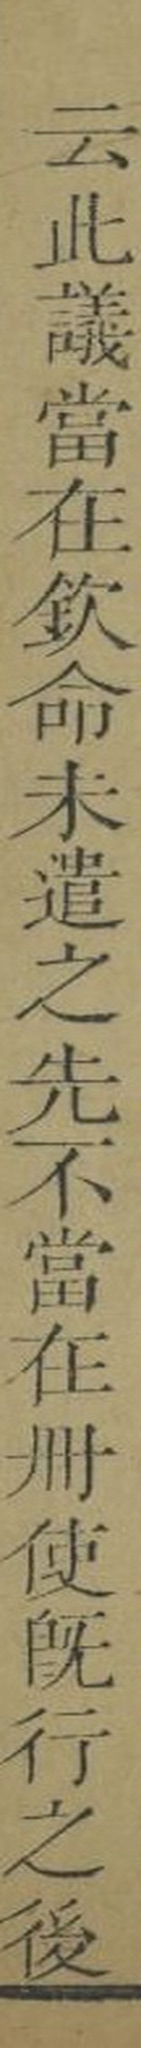云此議当在欽命未遣之先不当在冊使既行之後
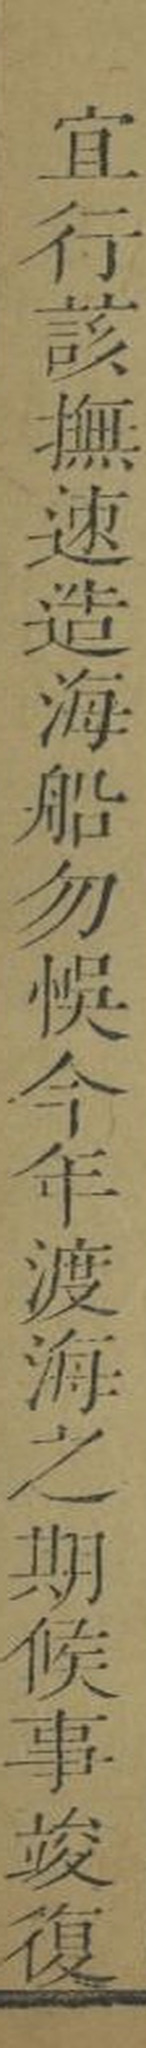宜行該撫速造海船勿悞今年渡海之期候事竣復

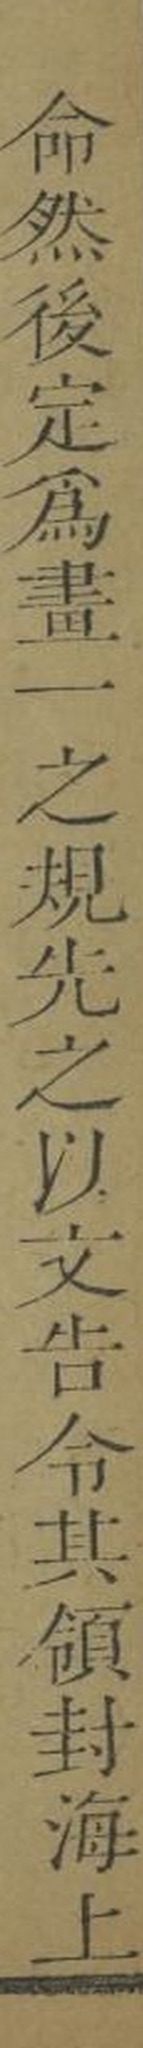命然後定為画一之規先之以文告令其領封海上
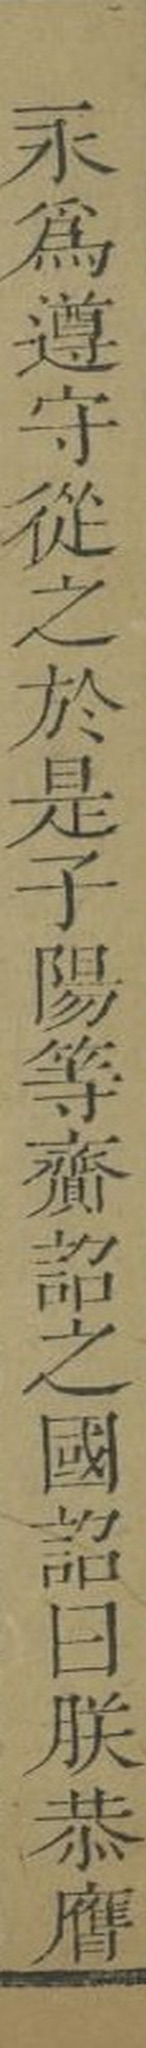永為遵守従之於是子陽等齎詔之国詔曰朕恭膺
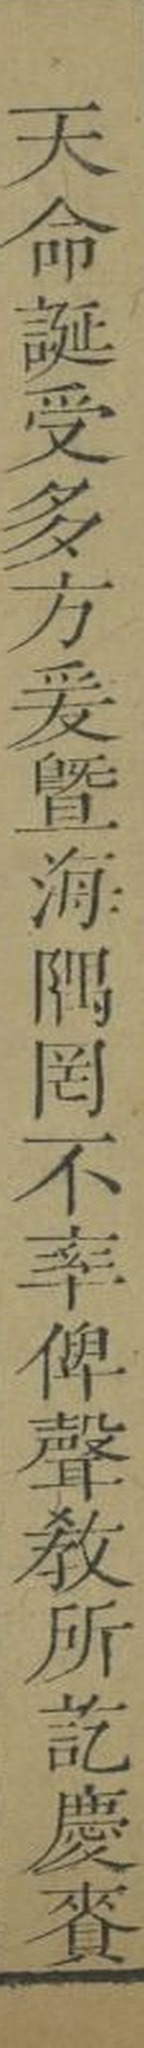天命誕受多方爰曁海隅罔不率俾声教所訖慶賚
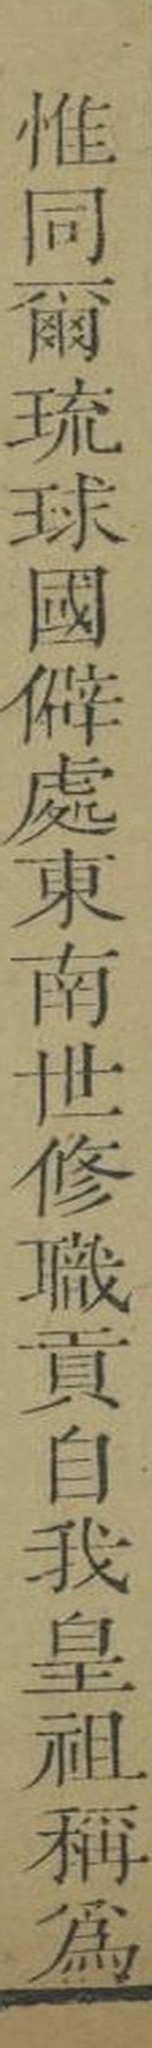惟同爾琉球国僻処東南世修職貢自我皇祖称為
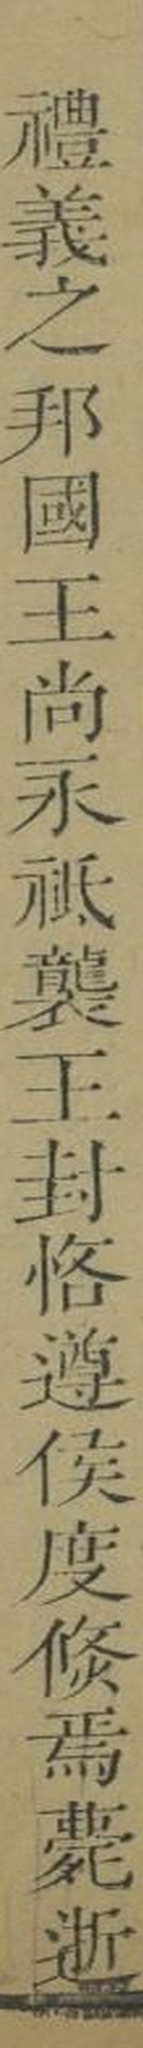礼義之邦国王尚永祇襲王封恪遵侯度倐焉薨逝
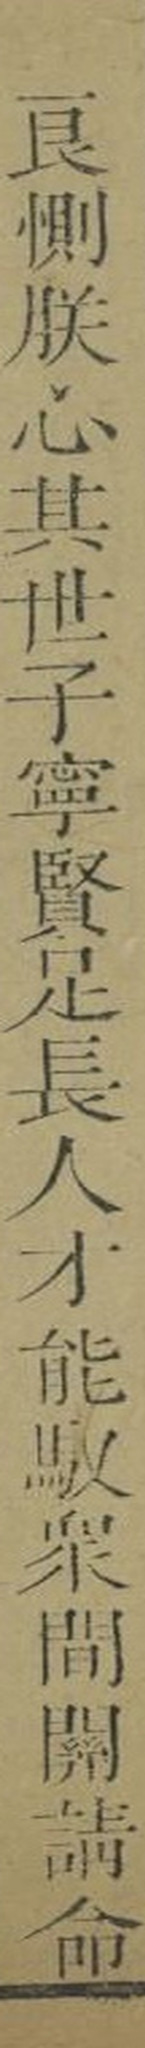良惻朕心其世子寧賢足長人才能馭衆間関請命
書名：中山伝信録 巻四
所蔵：University of the Ryukyus Library
